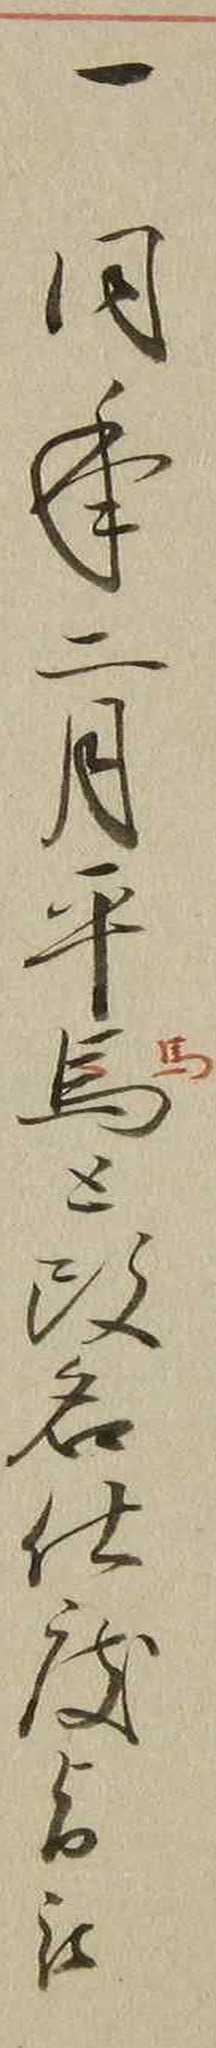一同年二月平馬と改名仕度旨被
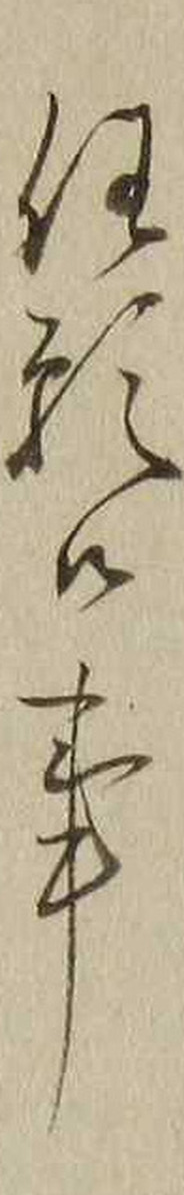任願候事
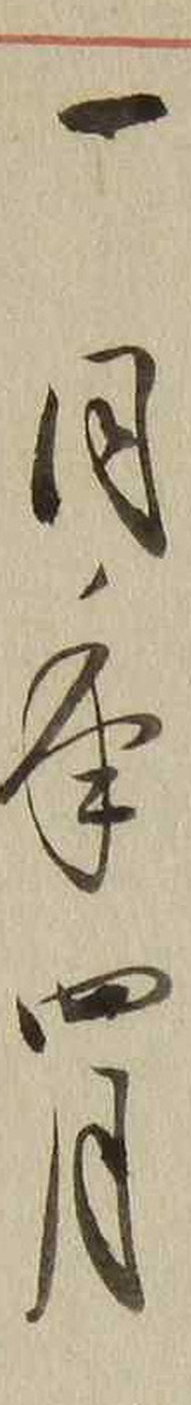一同年四月
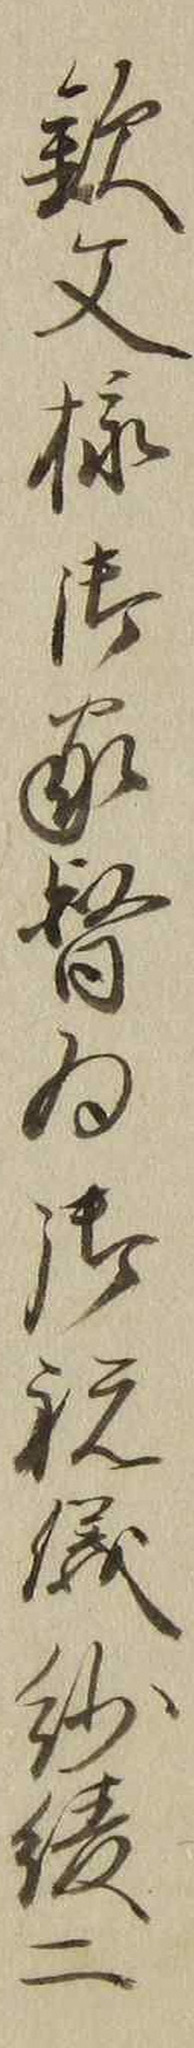欽文様御家督為御祝儀紗綾二
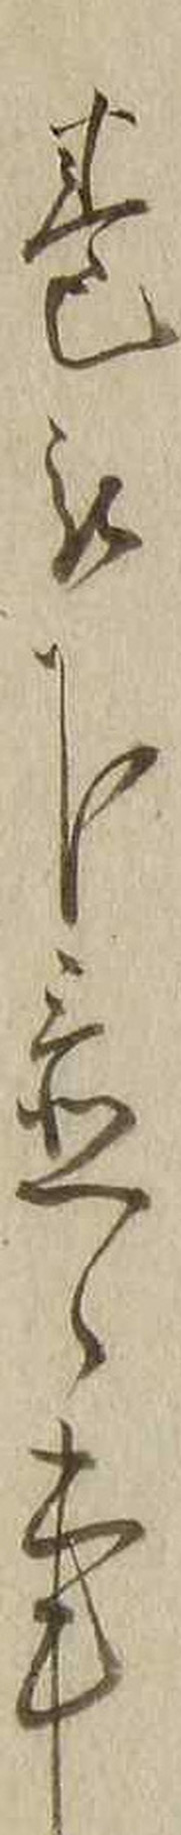巻被下置候事
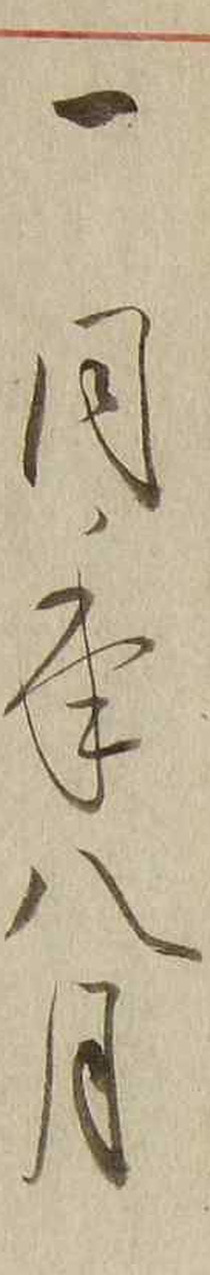一同年八月
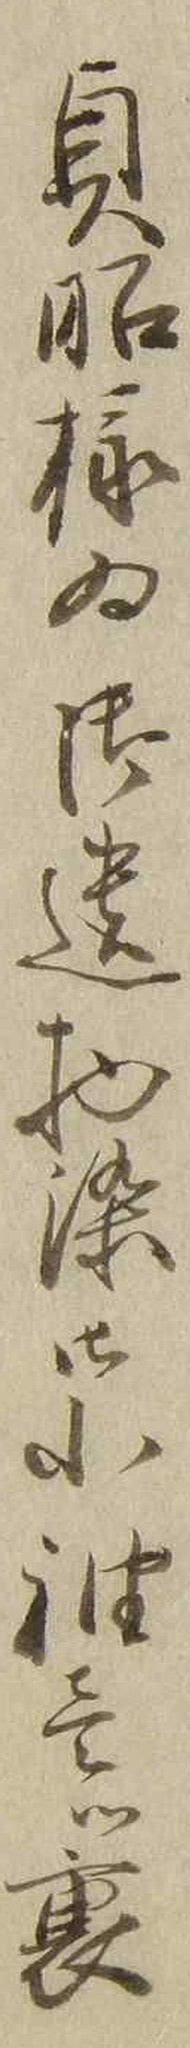貞昭様為御遺物染御小袖壱つ裏

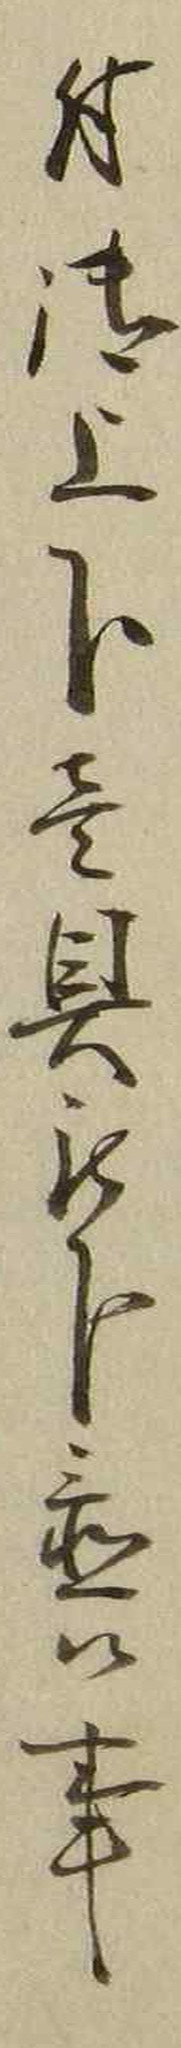付御上下壱具被下置候事
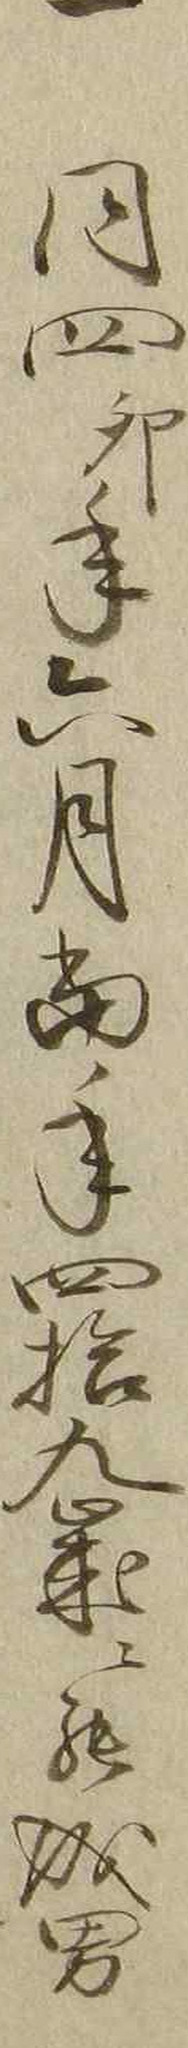一同四卯年六月当年四拾九歳に罷成男
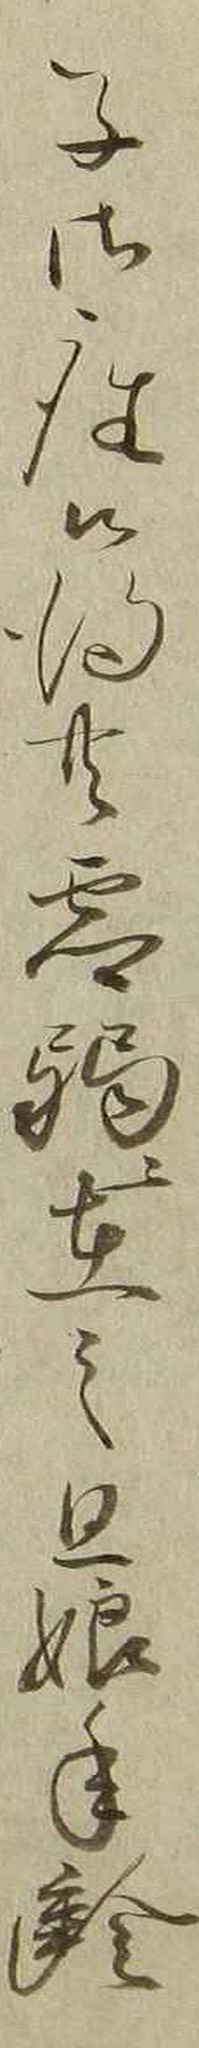子御座候得共零弱在之旦娘年齢
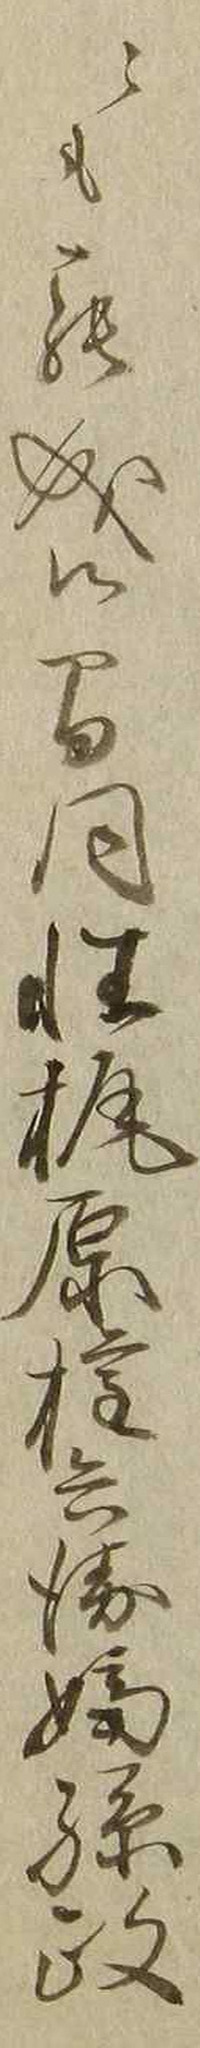にも罷成候間同性梶原権兵衛嫡孫政
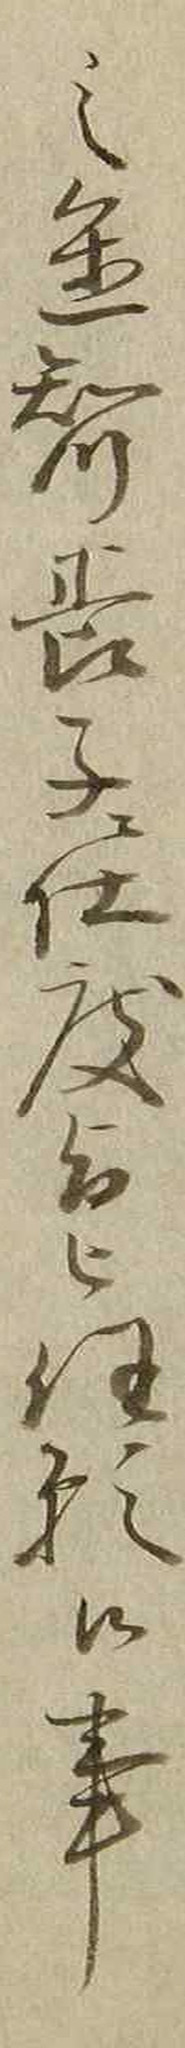之進聟養子に仕度旨被任願候事
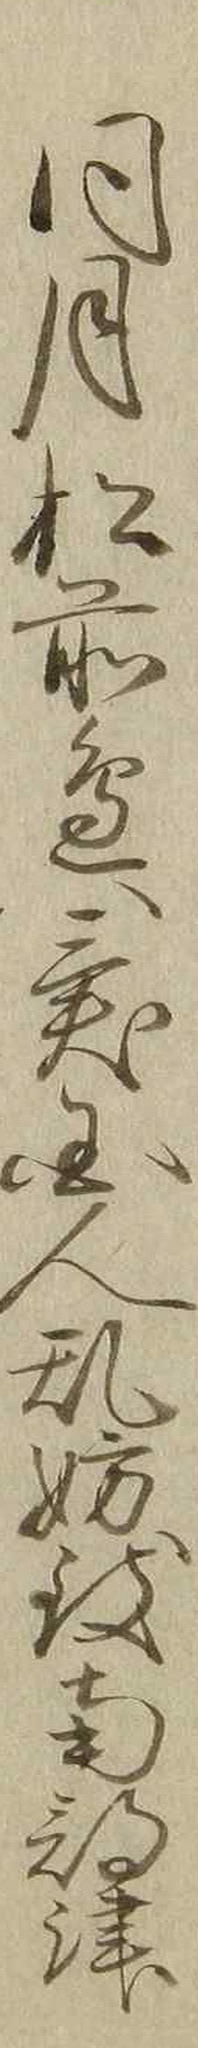一同月松前辺異国人乱坊致南部津
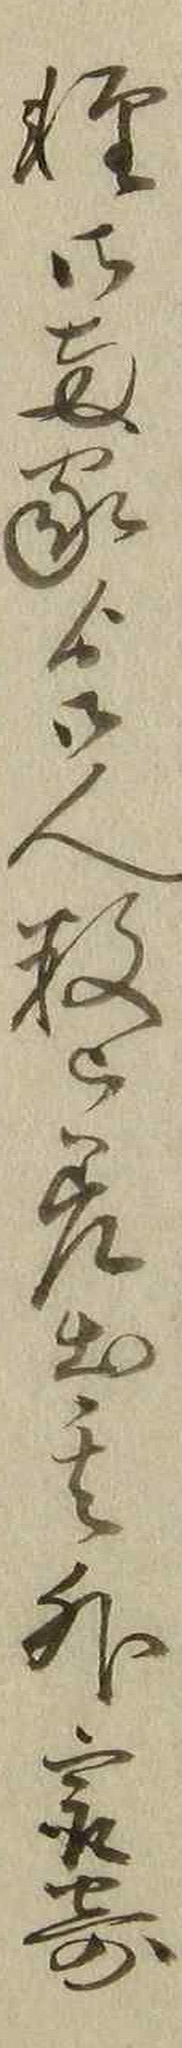軽御両家ゟ御人数被差出其外最寄
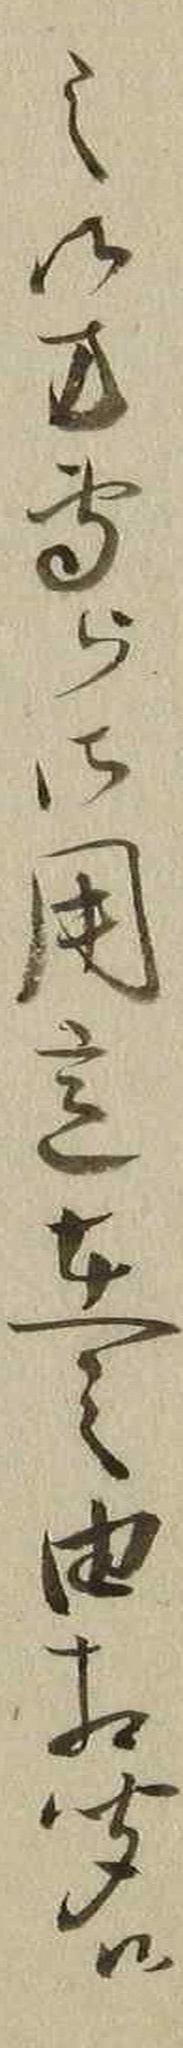之御方専ら御用意在之由相聞候
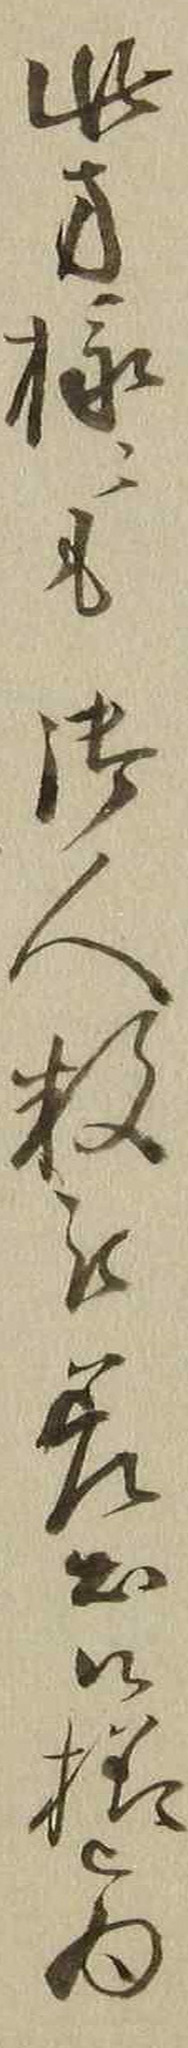此方様にも御人数被差出候様被為
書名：諸士系譜　巻之103　か之部11
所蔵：会津若松市立会津図書館
